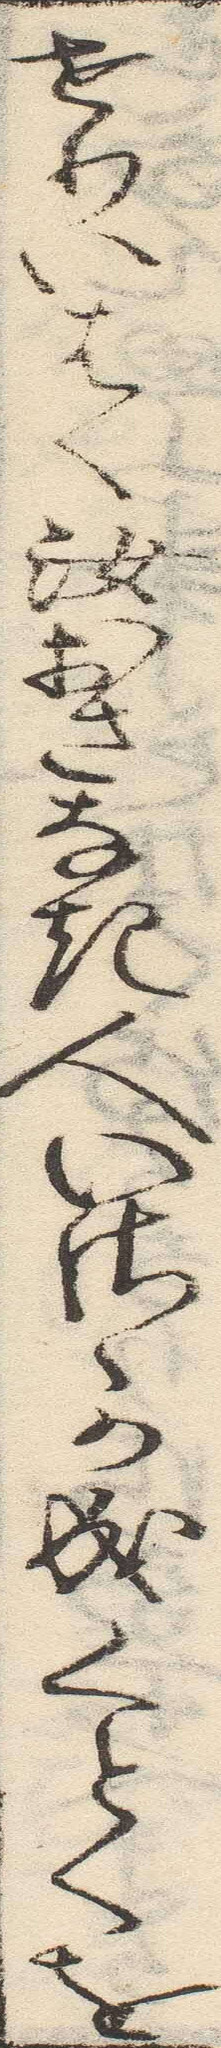せりいはく汝おさなき人いさゝか成くとくを
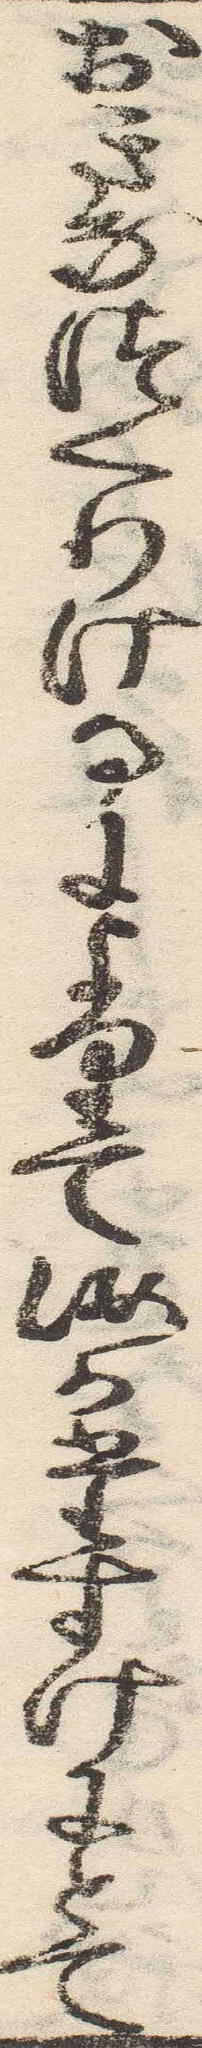おきなつくりけるによりて汝かたすけにとて
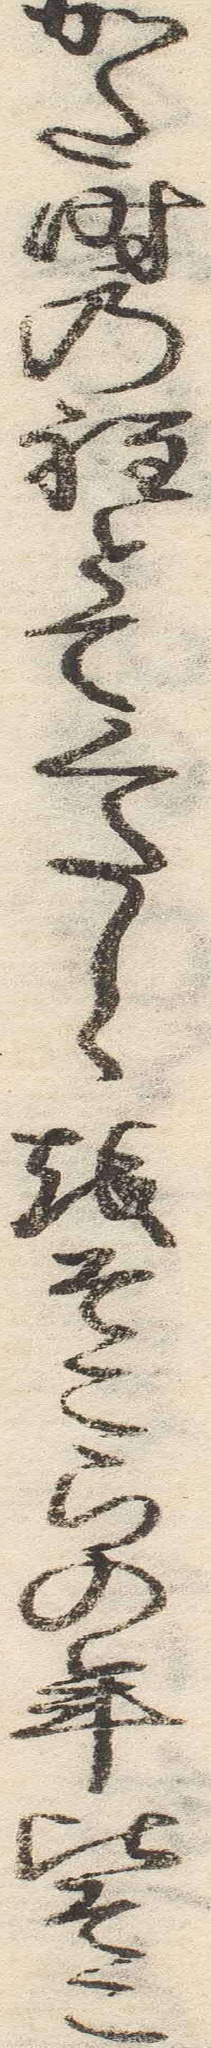かた時の程とてくたしゝをそこらの年頃そこ
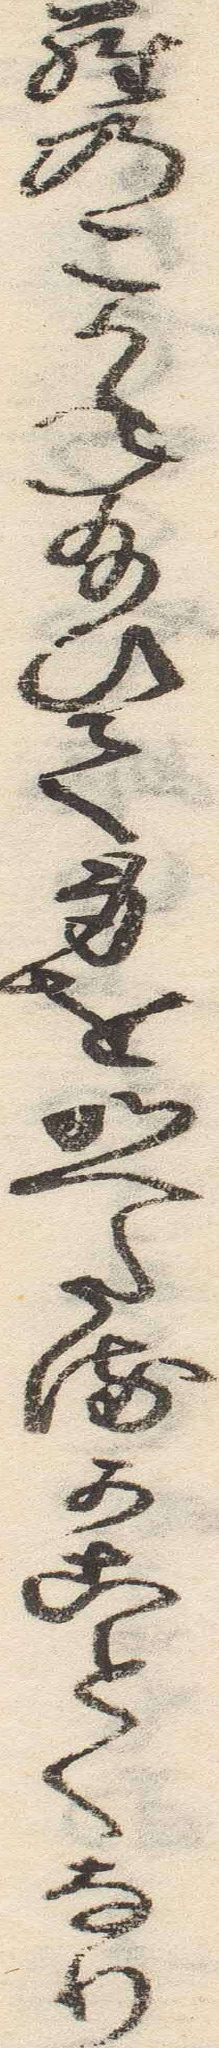らのこかね給ひて身をかへたるかことくなり
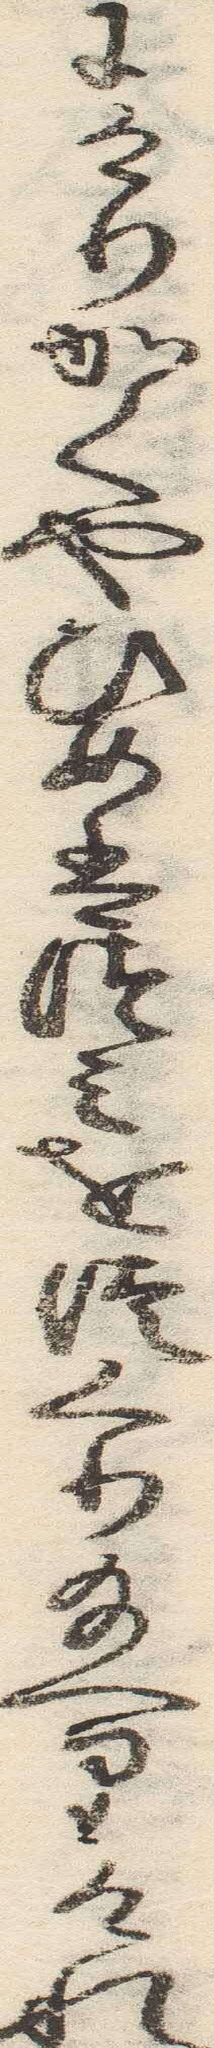にけりかくやひめはつみをつくり給へりけれ
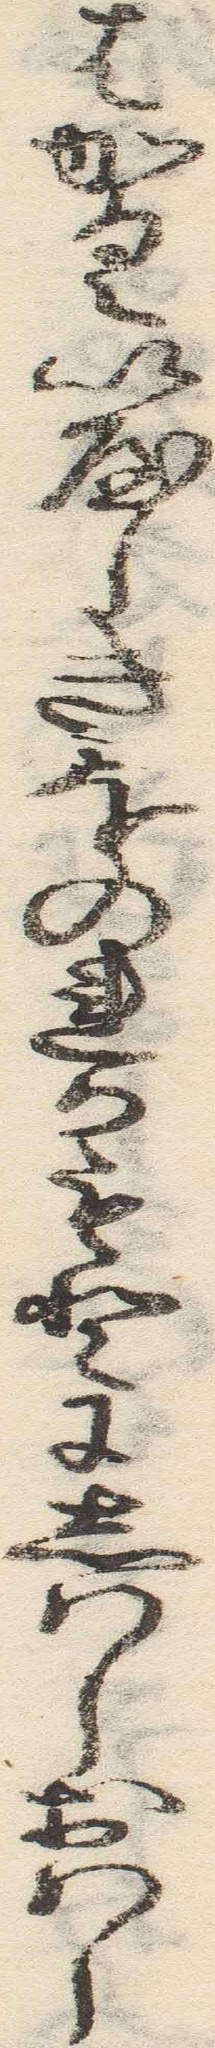はかくいやしきをのれかもとにしはしおはし
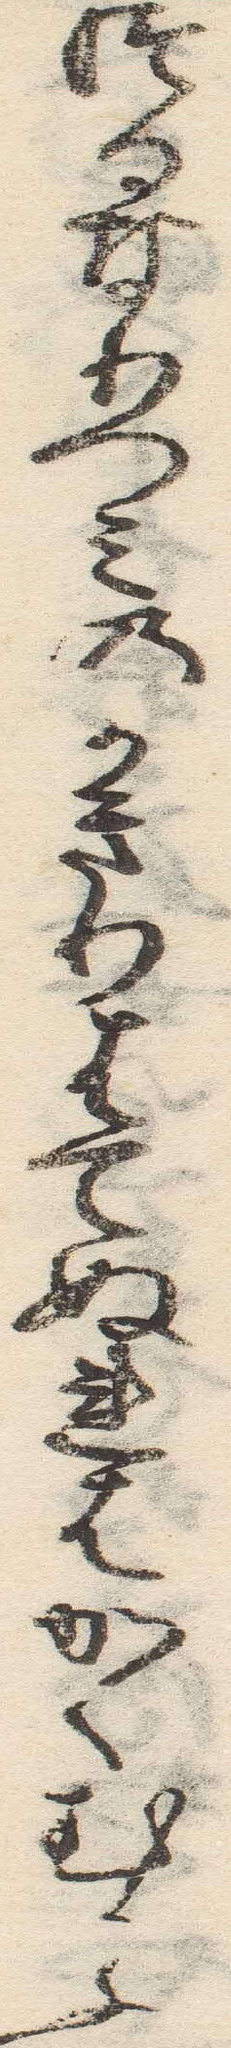つるなりつみのかきりはてぬれはかくむかふ
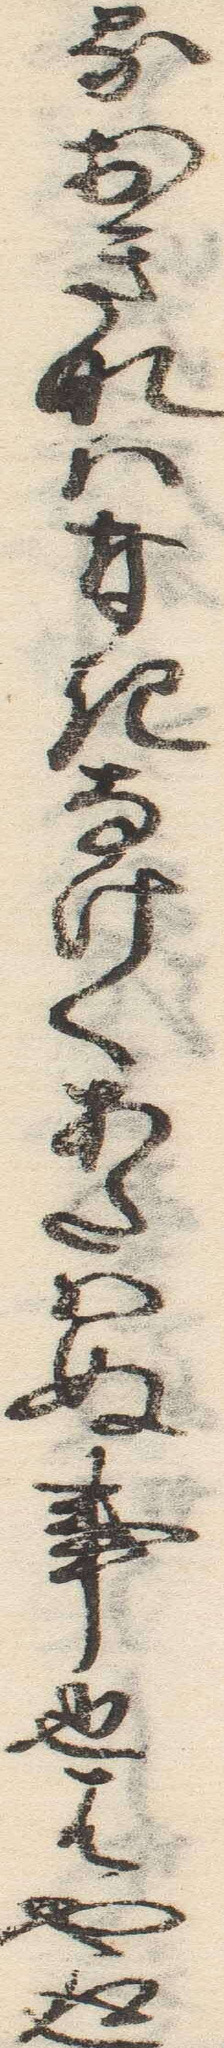るおきなはなきなけくあたはぬ事也はや返
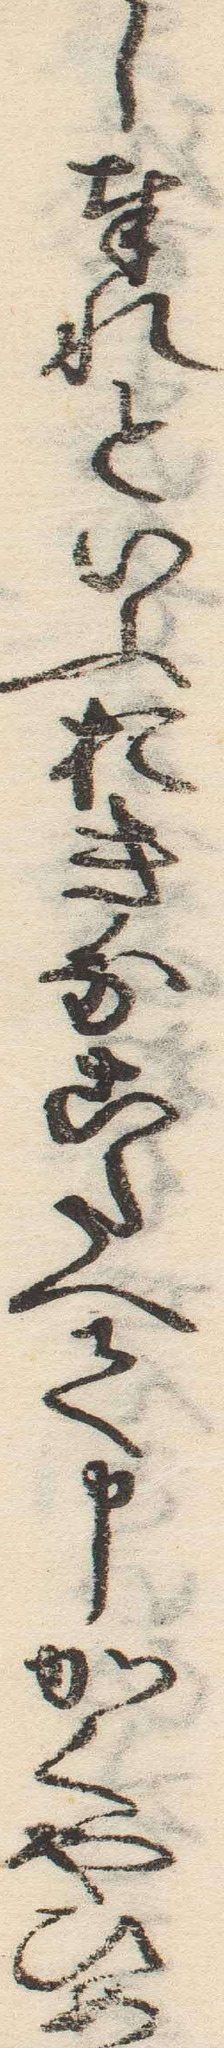し奉れといふおきなこたへて申かくやひめ
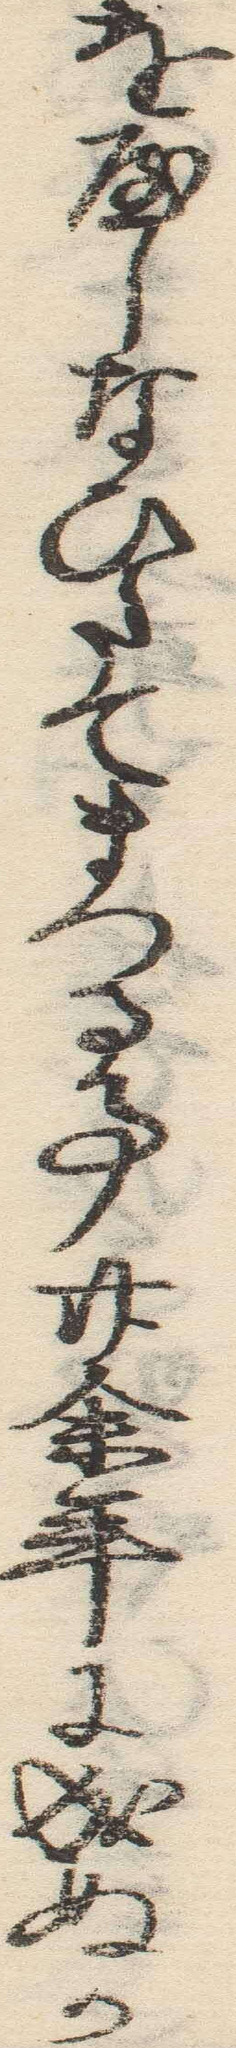をやしなひたてまつる事廿余年に成ぬか
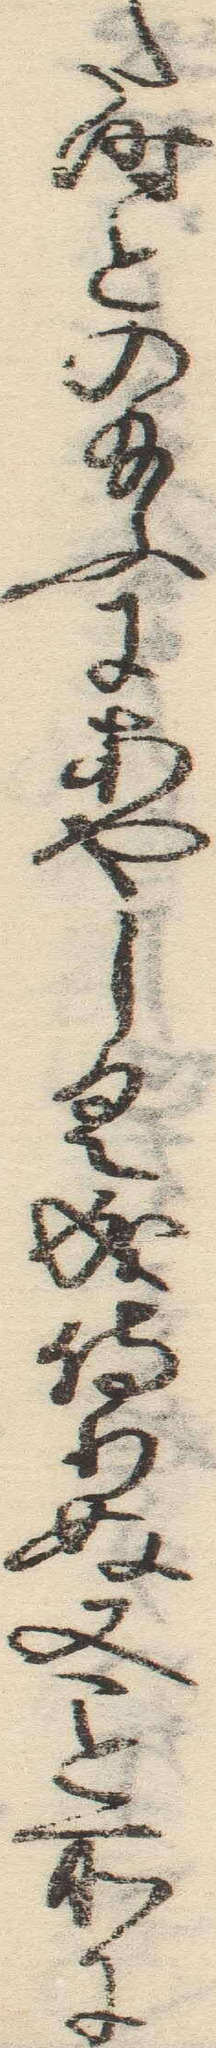た時との給ふにあやしく成侍りぬ又こと所に
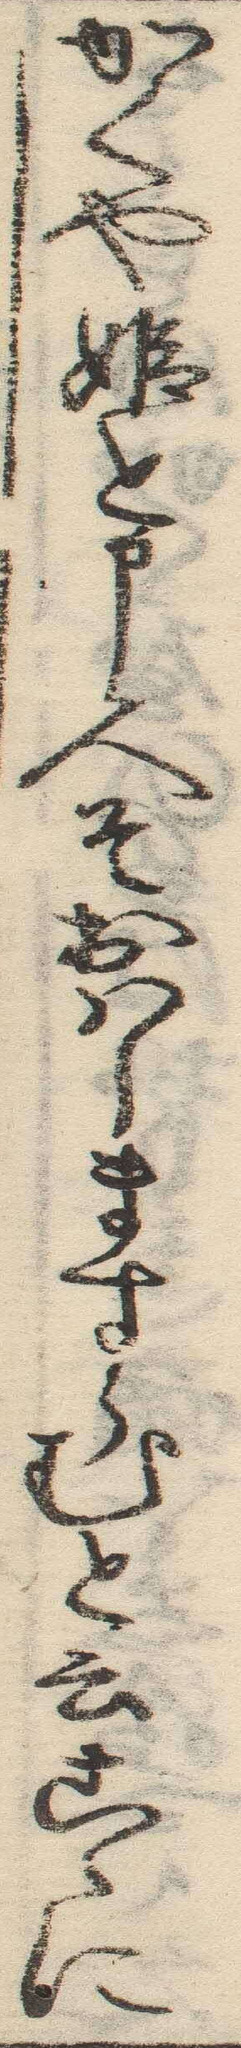かくや姫と申人そおはしますらむと云こゝに

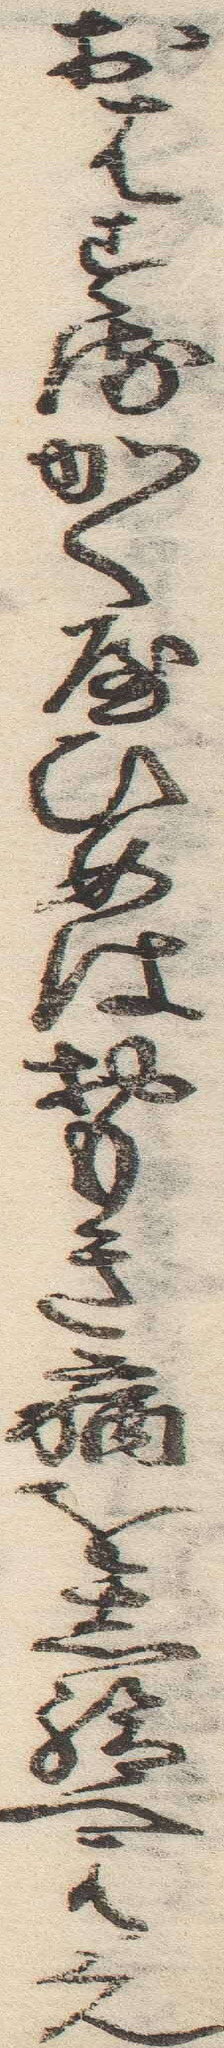おはするかくやひめはおもき病をし給へはえ
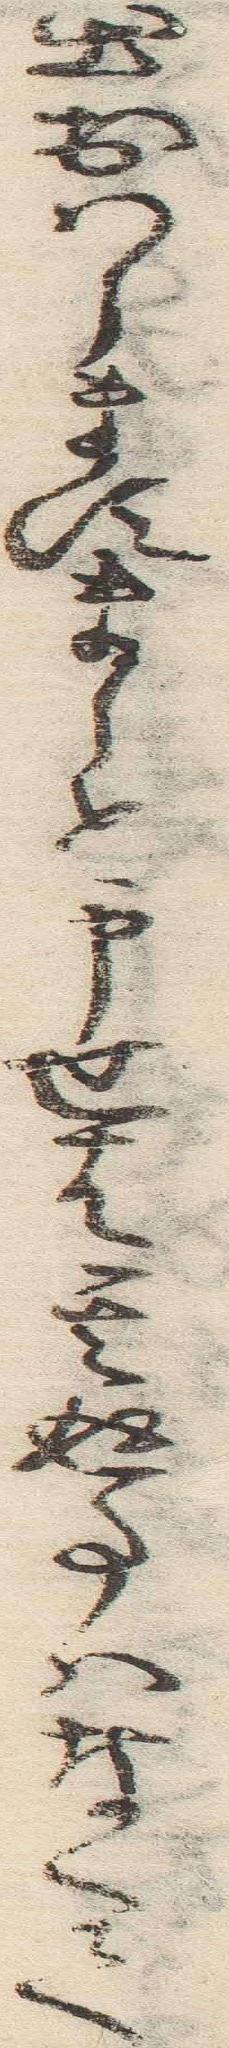出おはしますましと申せは其返事はなくて
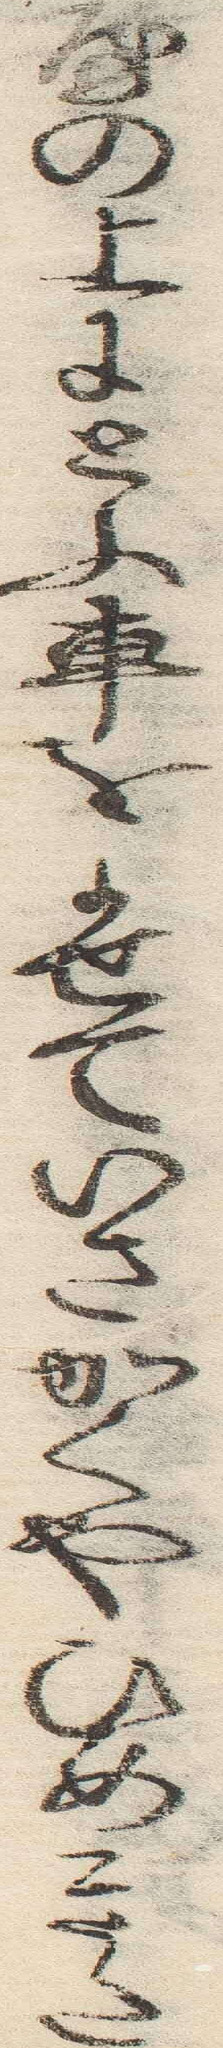屋の上にとふ車をよせていさかくやひめきた
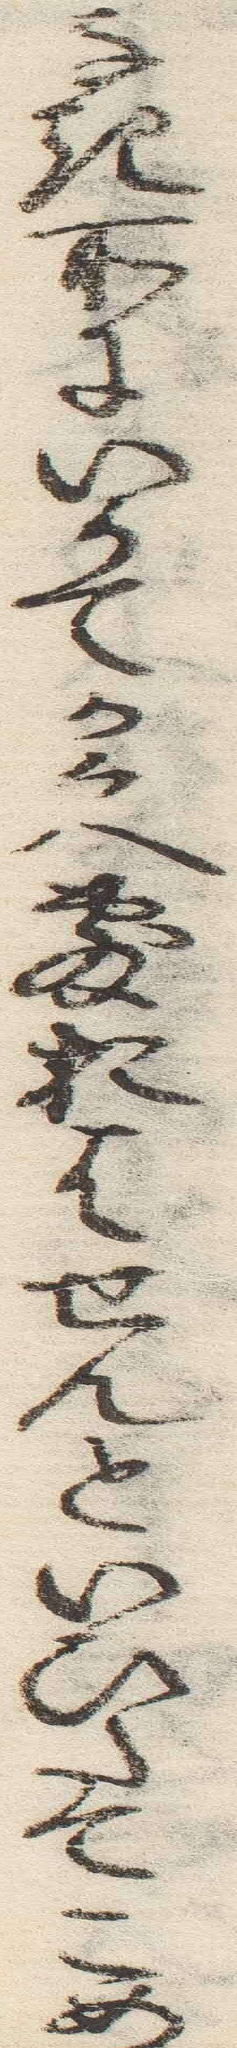なき所にいかてか久敷おはせんといひたてこめ
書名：竹取物語
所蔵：東京学芸大学附属図書館 国文学研究資料館
